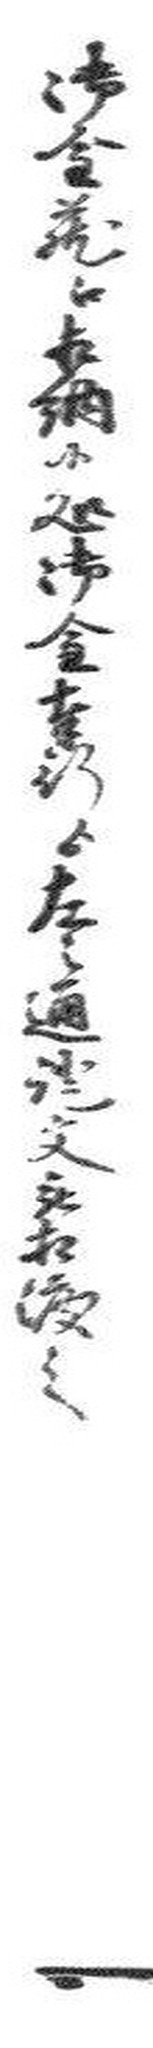御金蔵江相納候処御金奉行ゟ左之通証文被相渡之
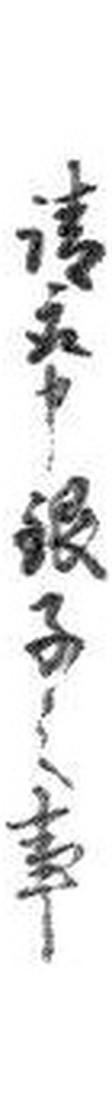請取申銀子之事
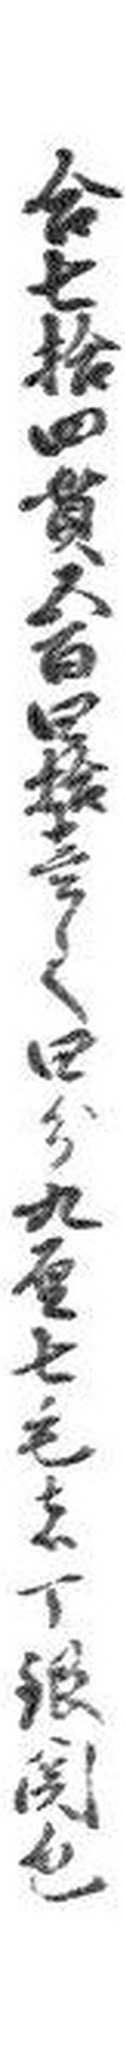合七拾四貫五百四拾壱匁四分九厘七毛者丁銀関包
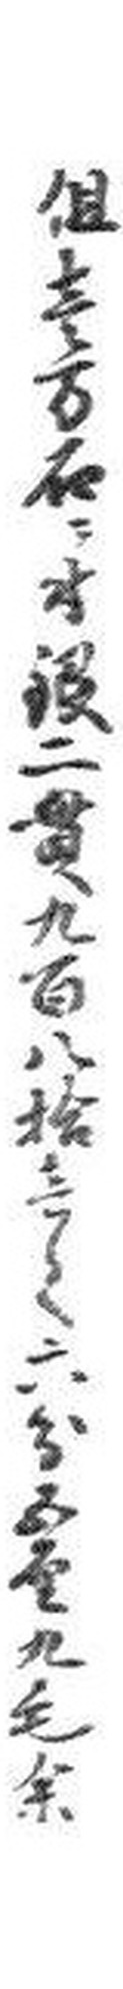但壱万石ニ付銀二貫九百八拾壱匁六分五厘九毛
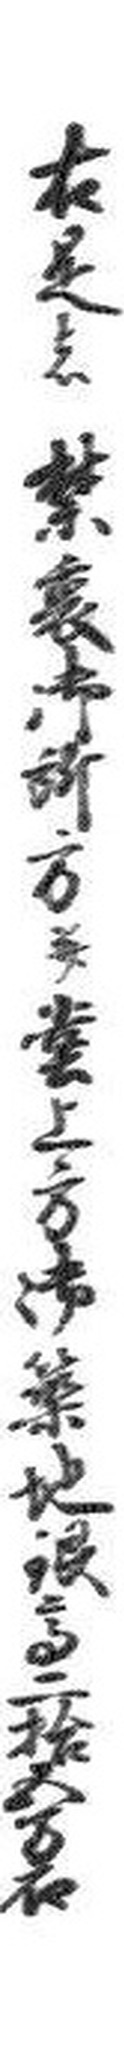右是者禁裏御所方并堂上方御築地銀高二拾五万石
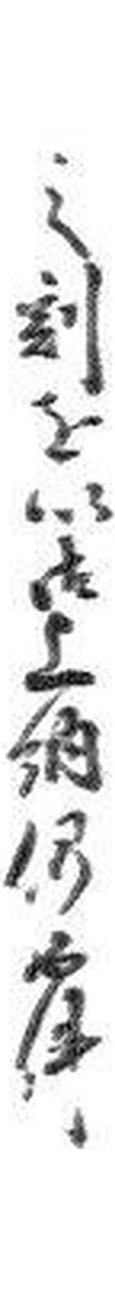之割を以御上納仍如件
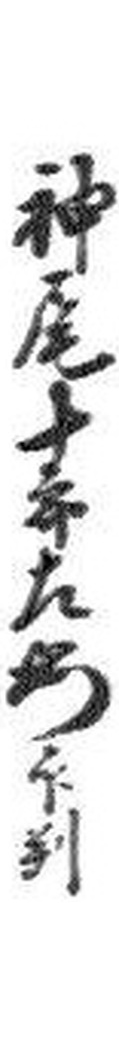神尾十郎左衛門印判
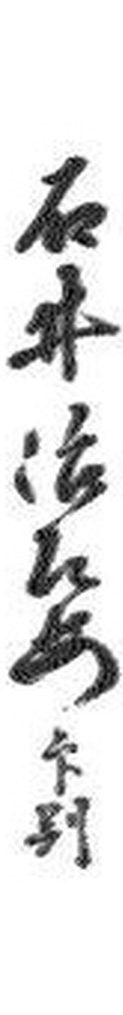石井治左衛門印判

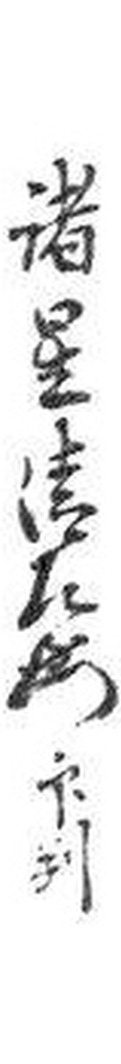諸星清左衛門印判
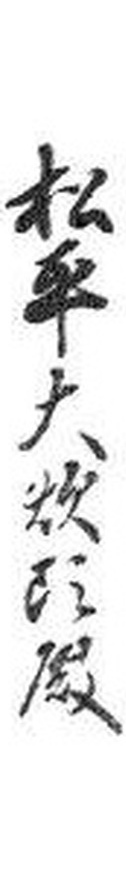松平大炊頭殿
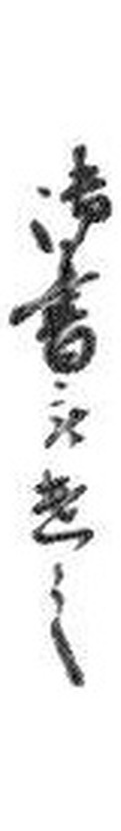御書被遣之
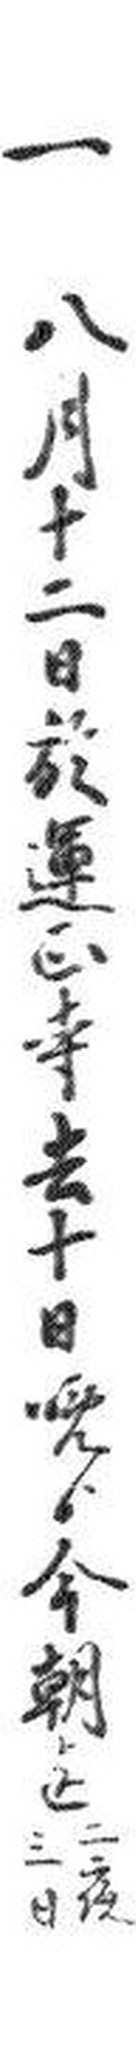一八月十二日於雲正寺去十日晩ゟ今朝迄二夜三日
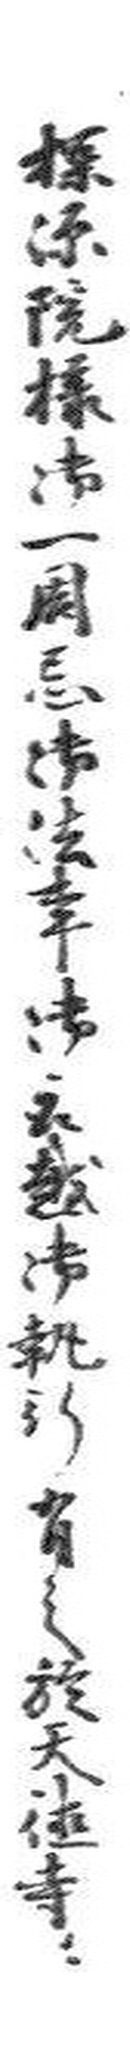探源院様御一周忌御法事御取越御執行有之於天徳寺ニ
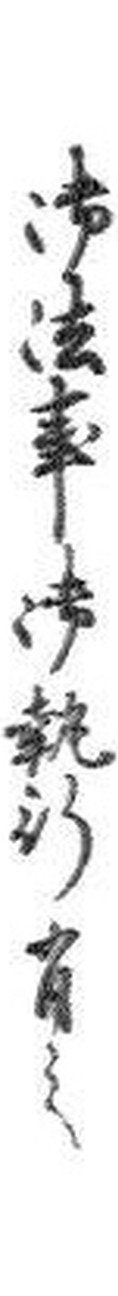御法事御執行有之
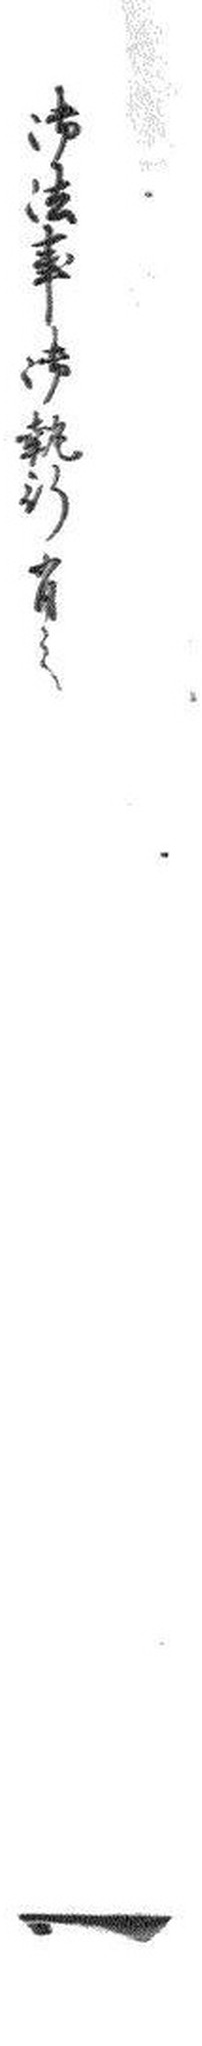御法事御執行有之
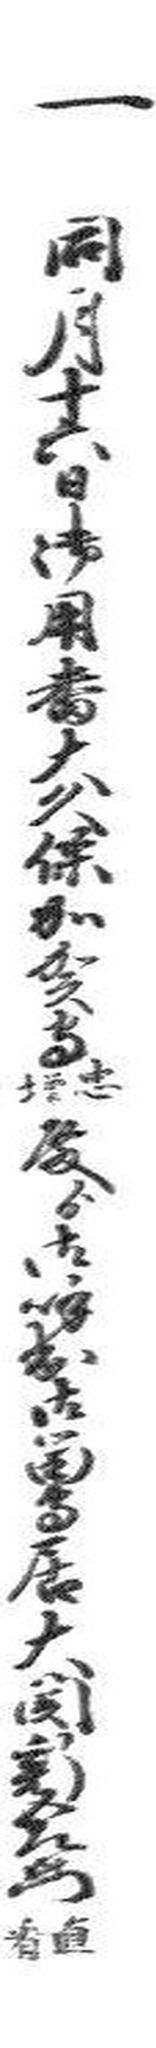一同月十六日御用番大久保加賀守忠増殿ゟ御呼出御留守居大関新五
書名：家譜 二十九 吉邦公 従正徳二年到正徳三年
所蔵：福井県文書館 Fukui Prefectural Archives
